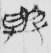與
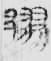鄝
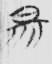昜（陽）
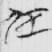佢
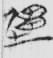疆
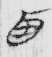西
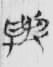與
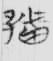鄱
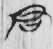君
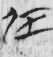佢
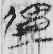疆
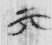亓
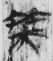簠
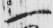一
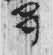邑
